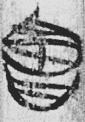會
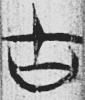古（故）
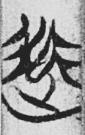○（帥）
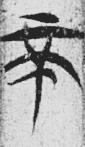不
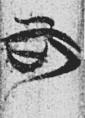可
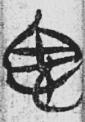思
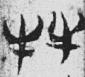牪牪
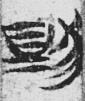則
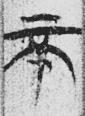不
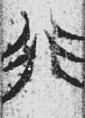行
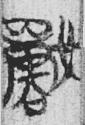○（戰）
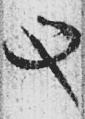又（有）
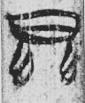○（顯）
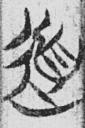道
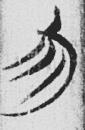勿
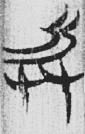兵
